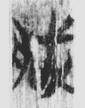○（莊）
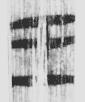王
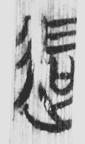○（跖）
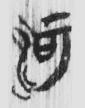河
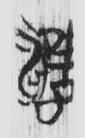○（雍）
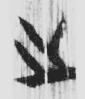之
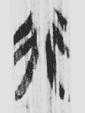行
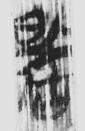暑（煮）
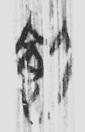飤（食）
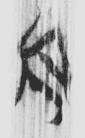於
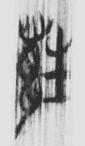鼪
